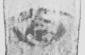百
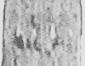卅
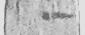一
